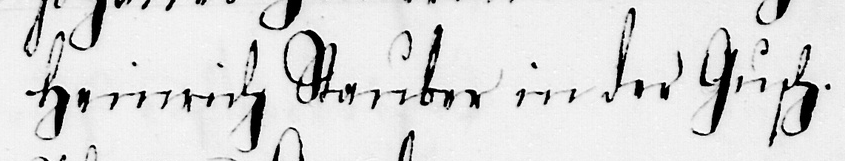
Heinrich Stauber in der Gusch.
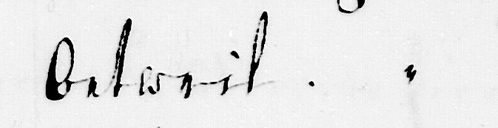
Oetweil
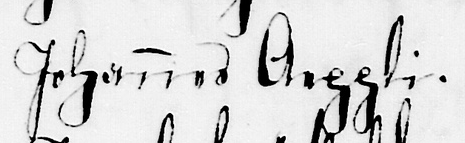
Johannes Aeppli.
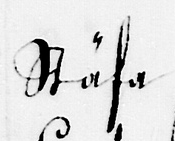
Stäfa
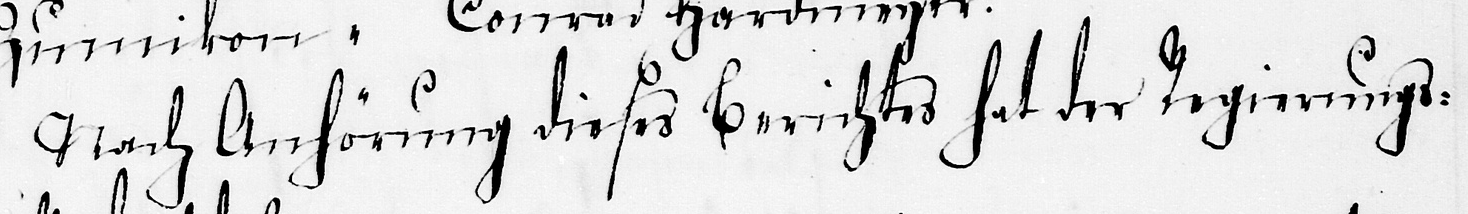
Nach Anhörung dieses Berichtes hat der Regierungs¬
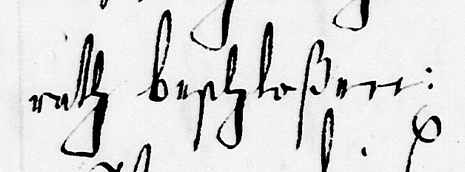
rath beschloßen:
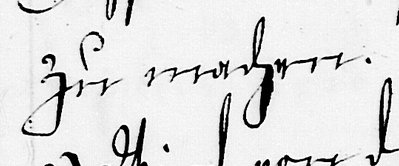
zu machen.
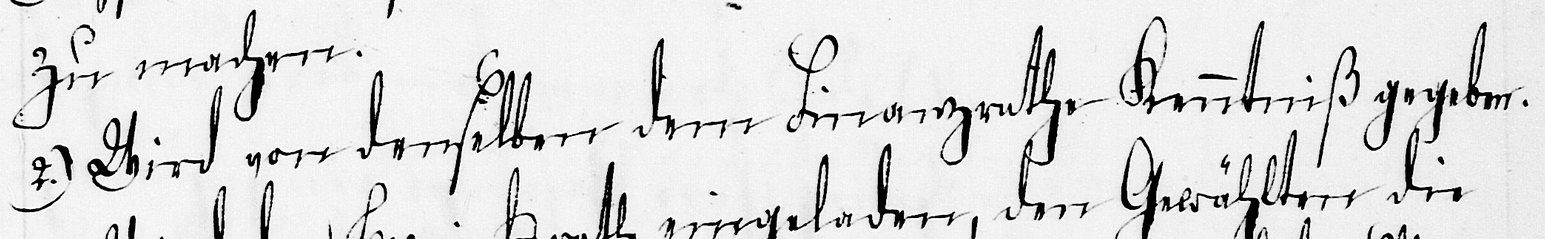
2.) Wird von denselben dem Finanzrathe Kenntniß gegebe¬
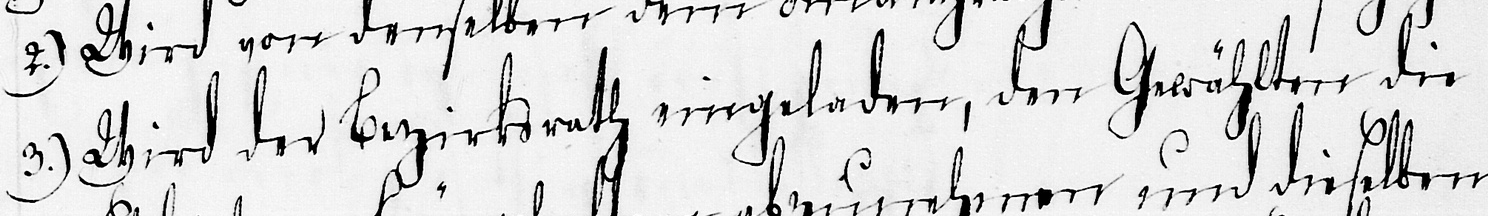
3.) Wird der Bezirksrath eingeladen, den Gewählten die
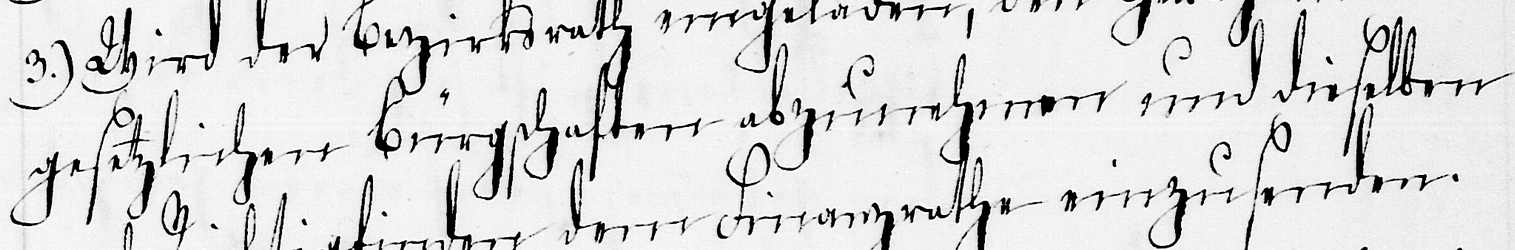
gesetzlichen Bürgschaften abzunehmen und dieselben
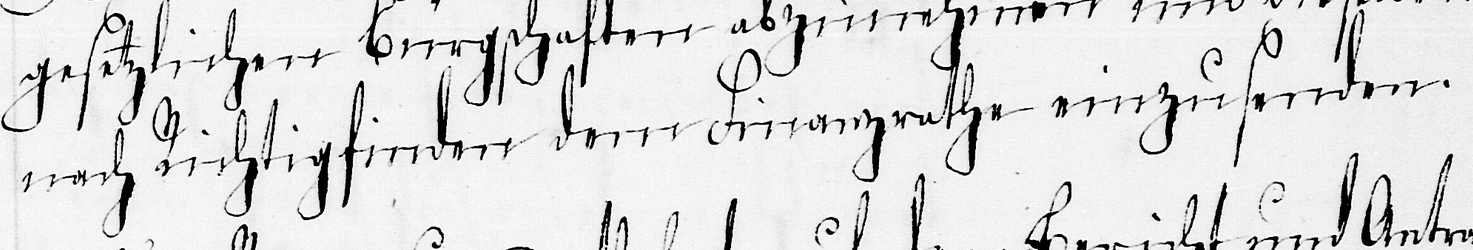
nach Richtigfinden dem Finanzrathe einzusenden.
